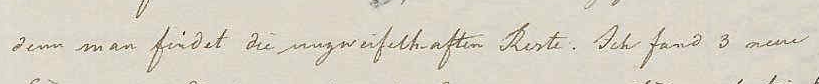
denn man findet die unzweifelhaften Reste. Ich fand 3 neue
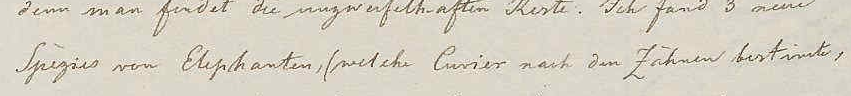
Spezies von Elephanten, (welche Cuvier nach den Zähnen bestimte
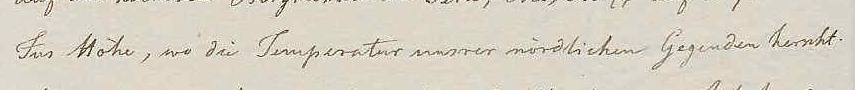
Fus Höhe, wo die Temperatur unsrer nördlichen Gegenden herscht.
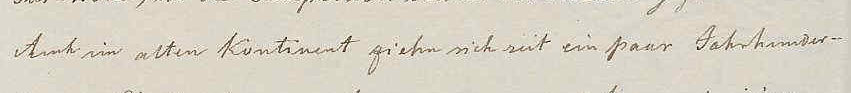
Auch im alten Kontinent ziehn sich seit ein paar Jahrhunder-
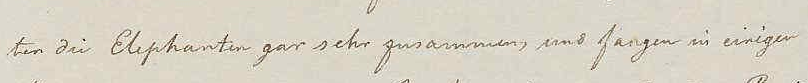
ten die Elephanten gar sehr zusammen, und fangen in einigen
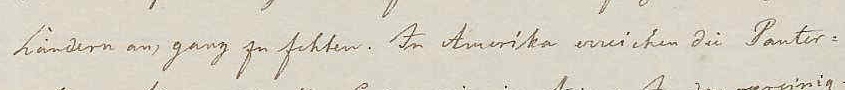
Ländern an, ganz zu fehlen. In Amerika erreichen die Panter-
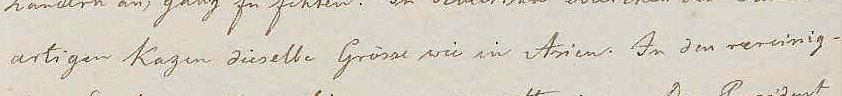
artigen Kazen dieselbe Grösse wie in Asien. In den vereinig-
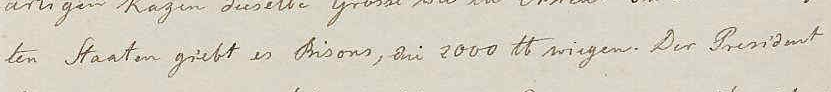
ten Staaten giebt es Bisons, die 2000 ℔ wiegen. Der President
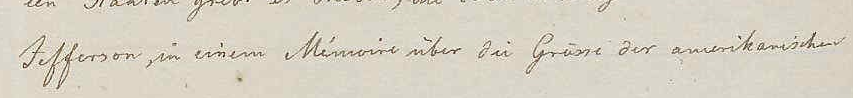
Jefferson, in einem Mémoire über die Grösse der amerikanischen
